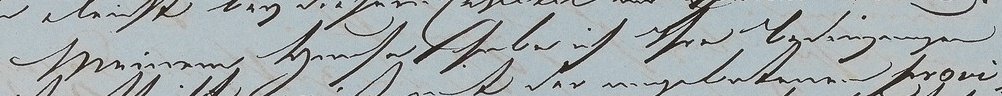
Meinem Hause habe ich Ihre Bedingungen
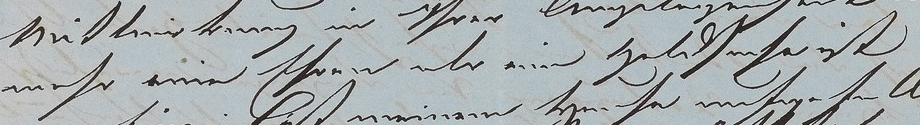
mehr eine Ehren als eine Geldsache ist.
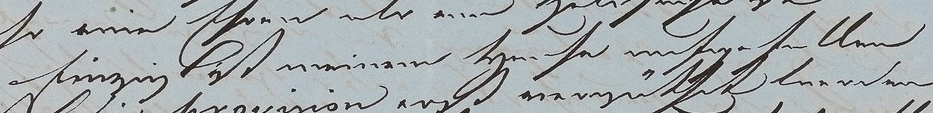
Einzig ist meinem Hause aufgefallen
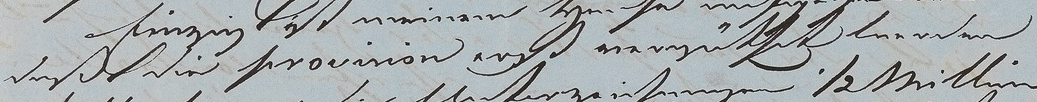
daß die provision erst vergüthet werden
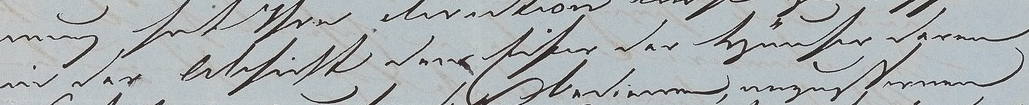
in der Absicht den Eifer der Häuser deren
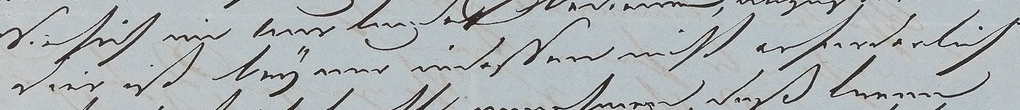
Dies ist bey uns indessen nicht erforderlich
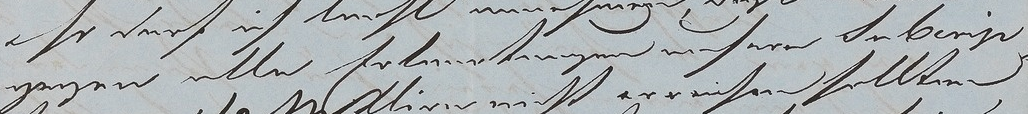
gegen alle Erwartungen unsere Subcrip-
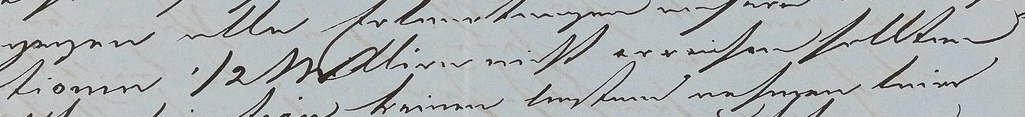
tionen ½ Million nicht erreichen sollten
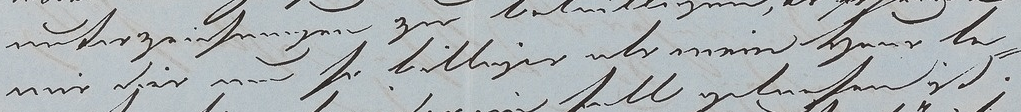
mir dies um so billiger als mein Haus be-
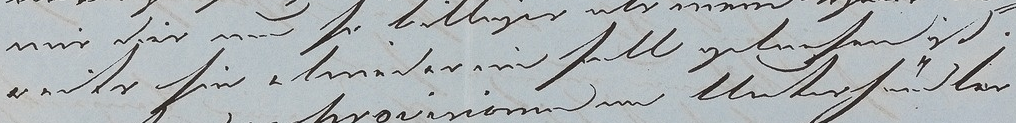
reits hin & wieder im Fall gewesen ist.
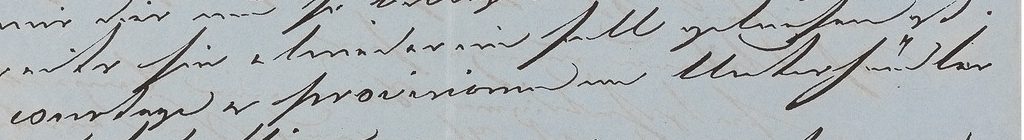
courtage & provisionen an Unterhändler
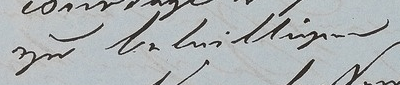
zu bewilligen.
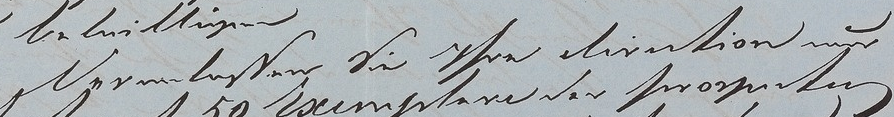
Veranlassen Sie Ihre direction uns
